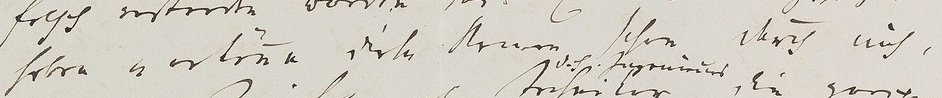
haben «er könne diese Namen schon durch mich,
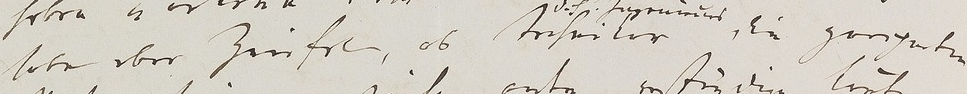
habe aber Zweifel, ob Techniker d. h. Ingenieurs, die geeigneten
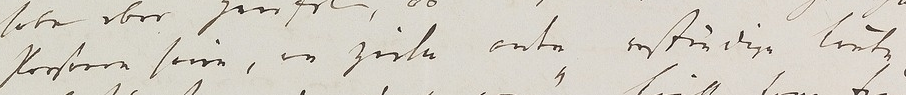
Personen seien, er ziehe andre verständige Leute
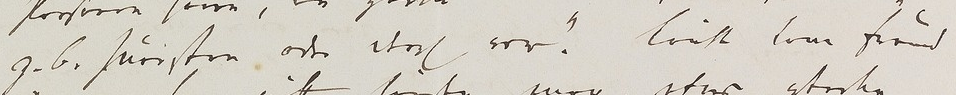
z. B. Juristen oder dergleichen vor». Leicht kann Freund
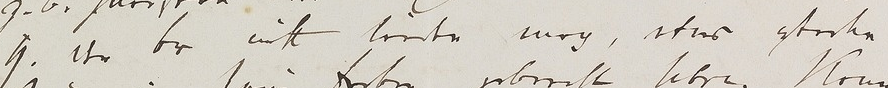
H. der Br nicht leiden mag, etwas starke
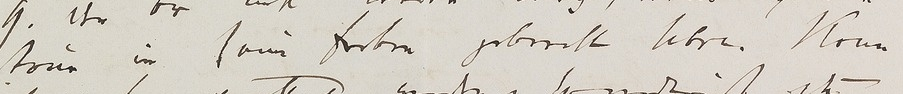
Töne in seine Farben gebracht haben. Kann
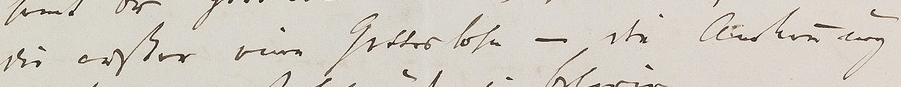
dir außer einen Gotteslohn – die Anerkennung
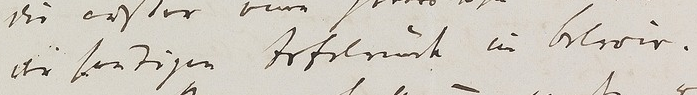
der heutigen Tafelrunde im Belvoir.
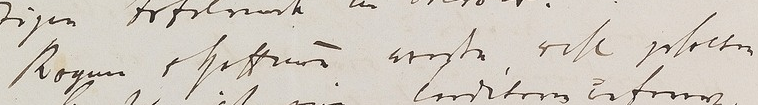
Rogner & Hoffmann werden wohl gehalten
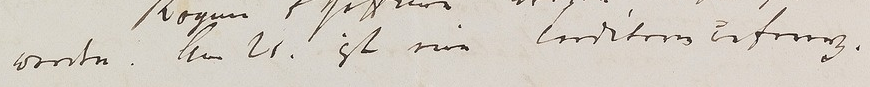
werden. am 21. ist eine Creditoren-conferenz.
